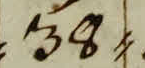38
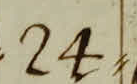24
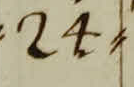24
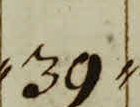39
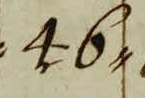46
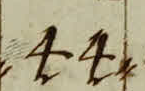44
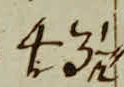43
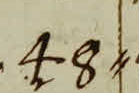48
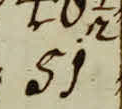51
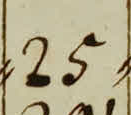25
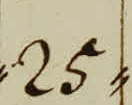25
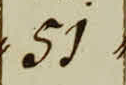51
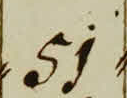51
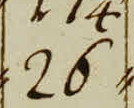26
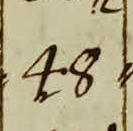48
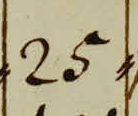25
